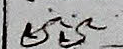55
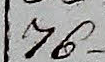76
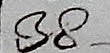38
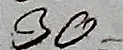30
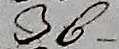36
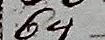64
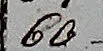60
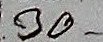30
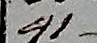41
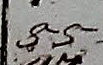55
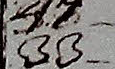33
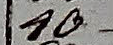40
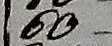60
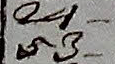53
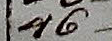46
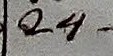24
